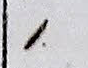1.
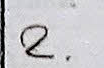2
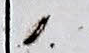1.
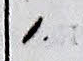1.
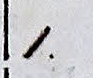1.
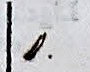1.
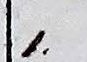1.
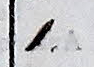1.
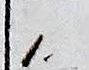1.
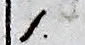1.
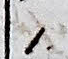1
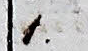1.
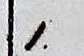1.
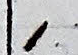1
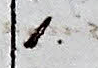1.
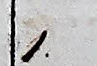1.
